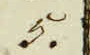5.
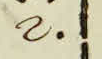2.
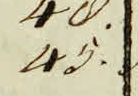45.
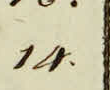14.
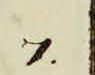7.
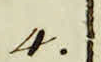4.
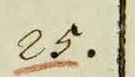25.
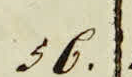56.
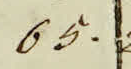65.
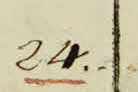24.
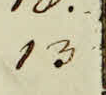13
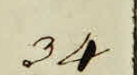34
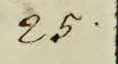25
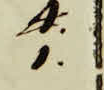1.
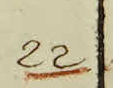22
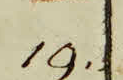19.
